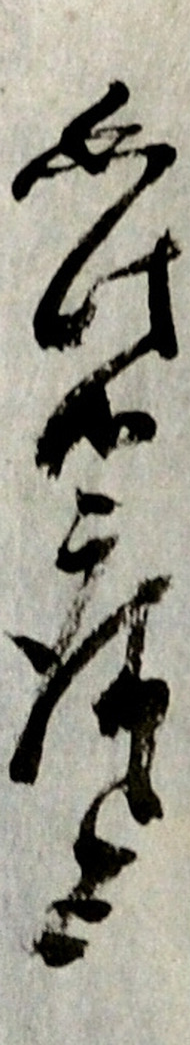如此御座候以上

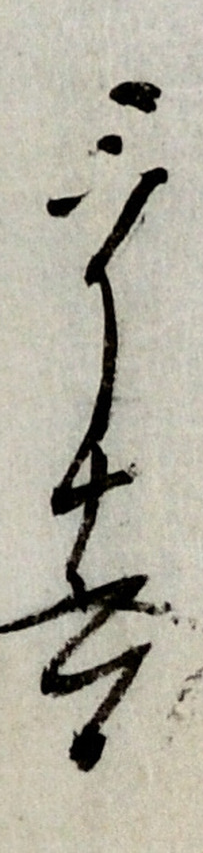三月十六日
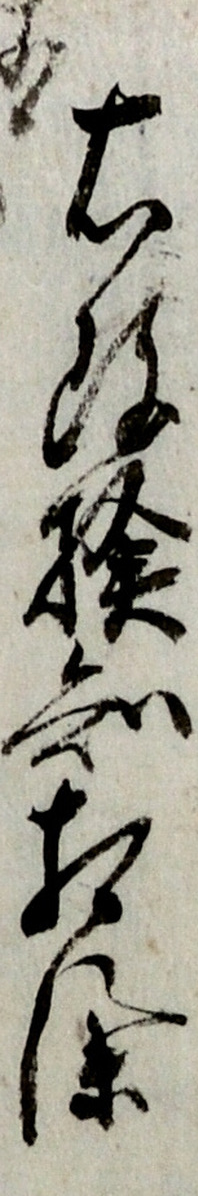右改検知相済
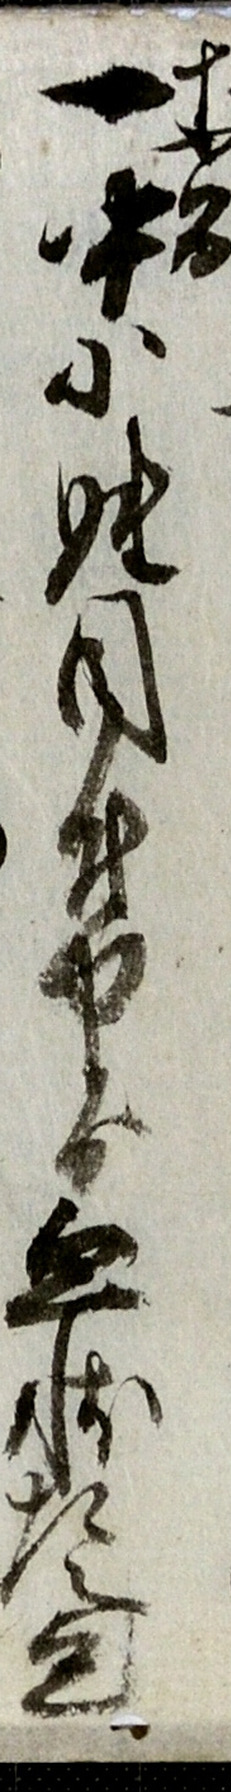一中小姓目付中ゟ廻状左之通
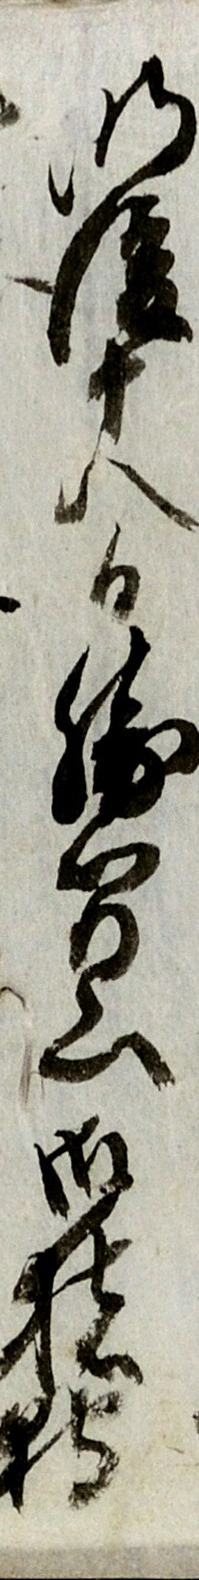明後十八日勝間山御猪狩
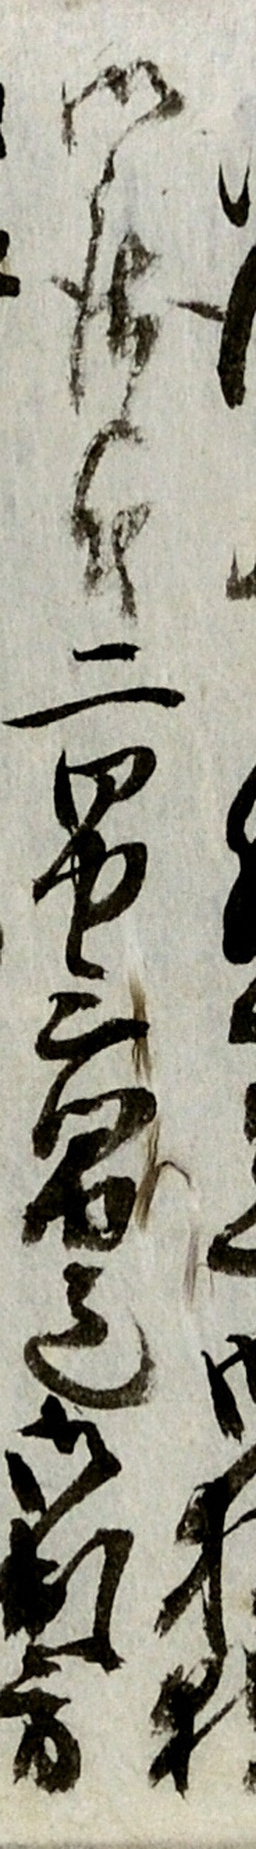御座候ニ付二男三男迄御出し方
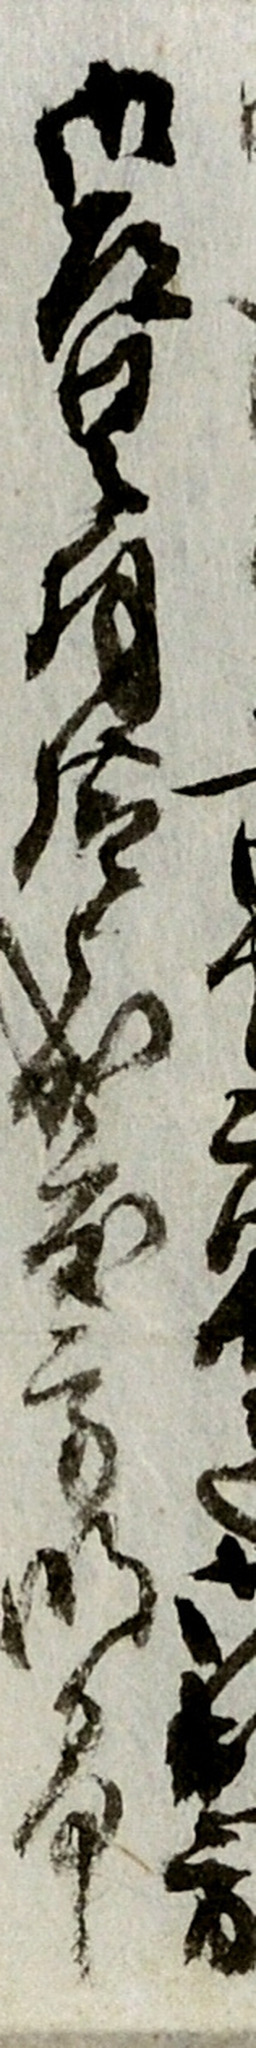御道具拝借被成度方明日中
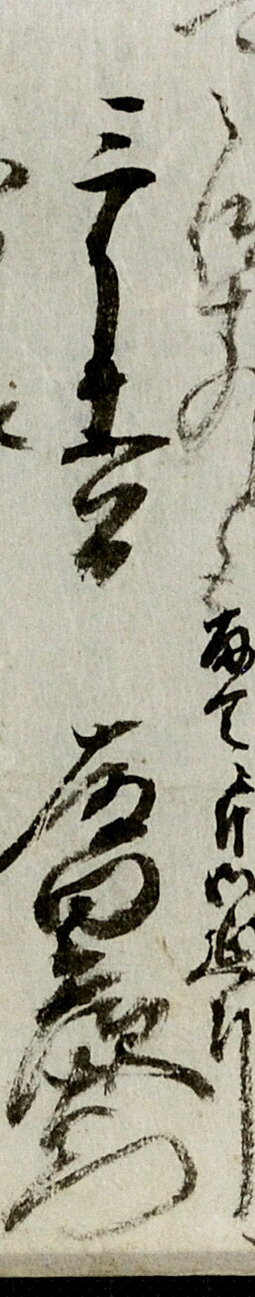三月十六日藤田彦右衛門
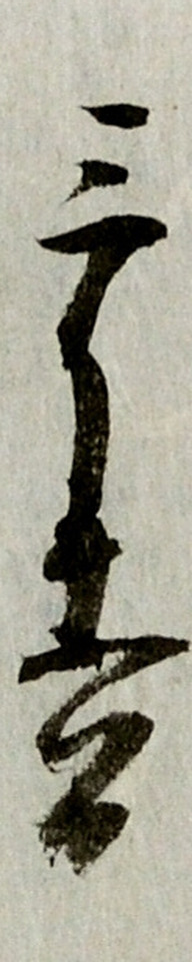三月十六日
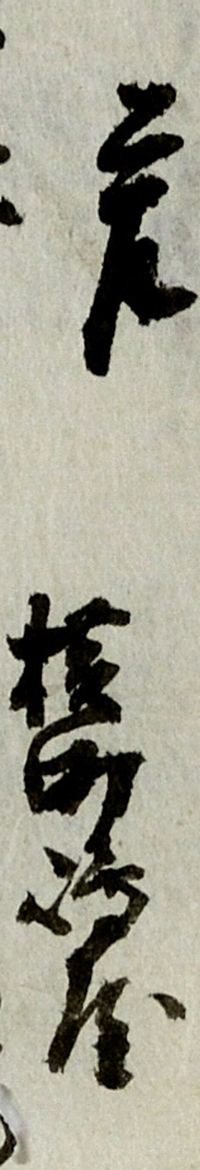横町嶋屋
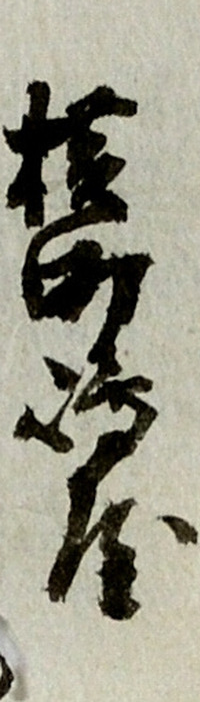横町嶋屋
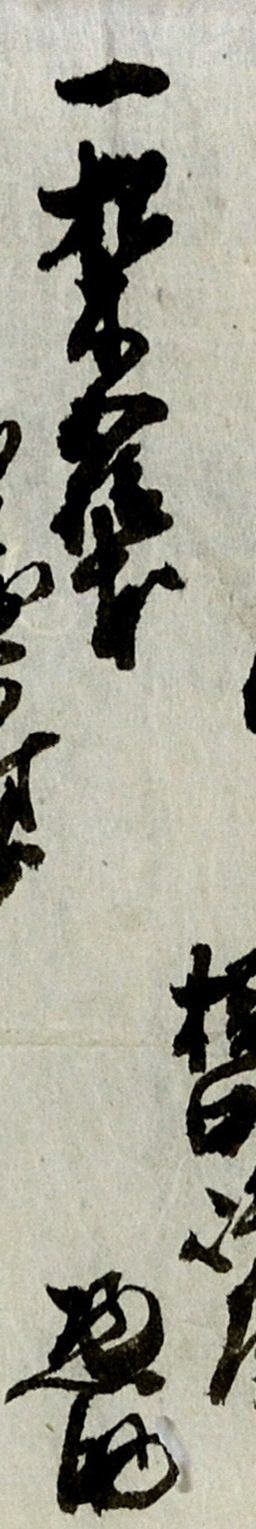一松木五拾本惣助
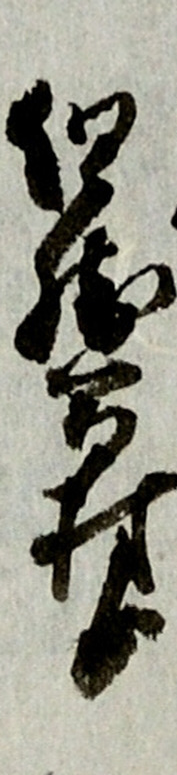但勝間村ゟ
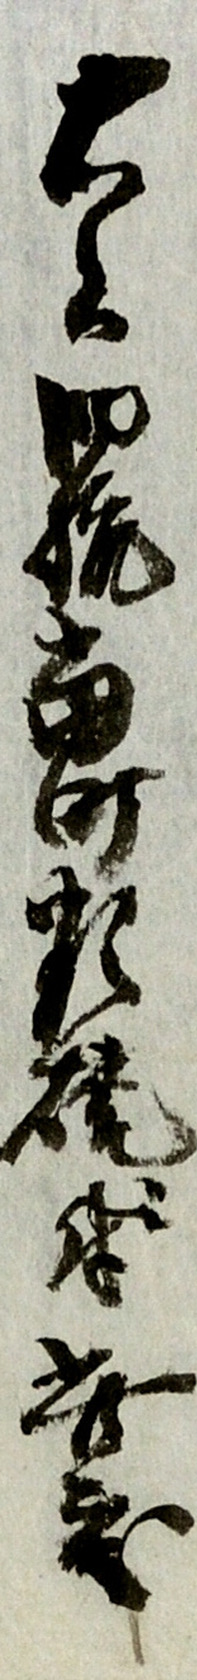右は旧臘当町類焼ニ付此度
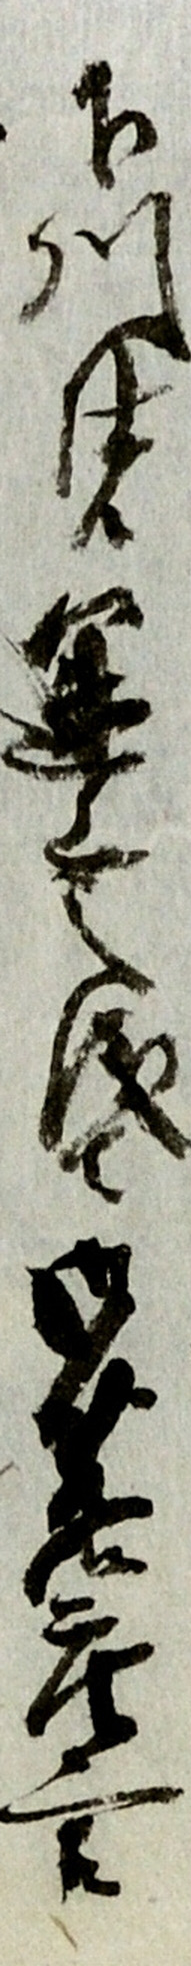下川仕候運上之儀は御免御無座候へ共
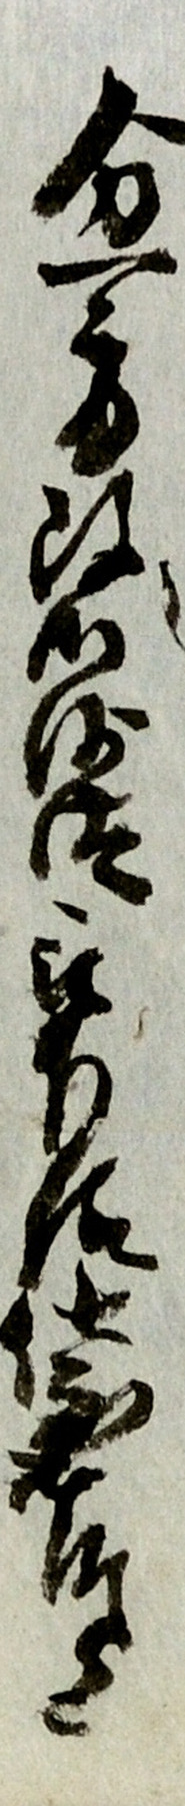分一方改御沙汰被下様仕度奉存候以上
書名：分一方諸事御用留帳
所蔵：伊那市立高遠町図書館・合同会社AMANE
